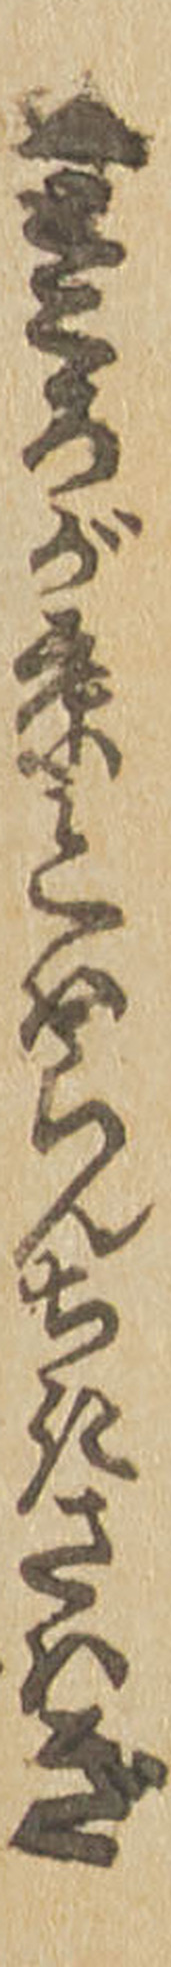▲ところが京とハらんちきさはぎ
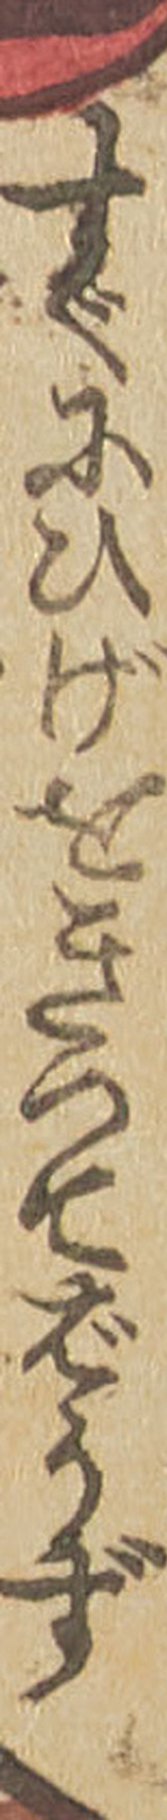すぐにひげをきつてばうず
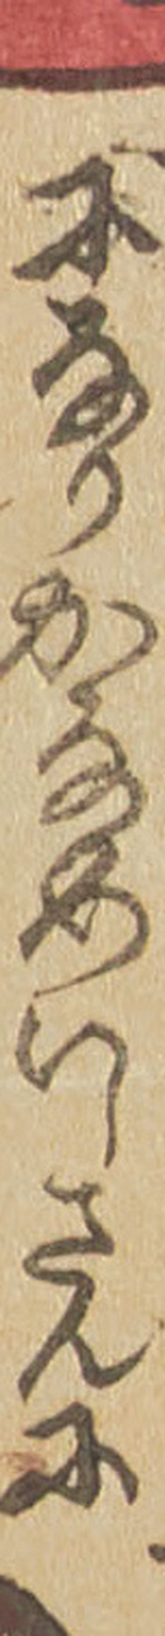になりかなめいしさんに
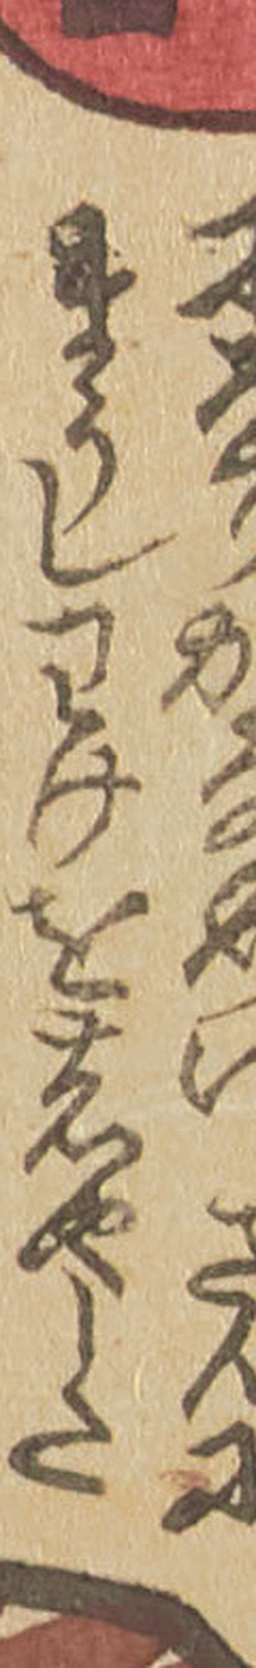まうしわけをしやした
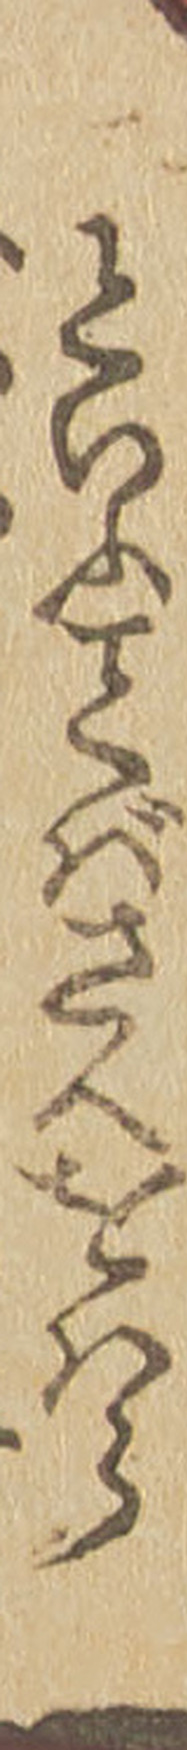といふことばさへをはら
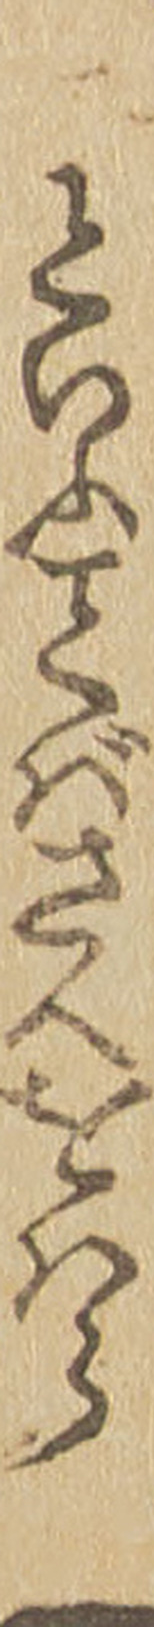といふことばさへをはら
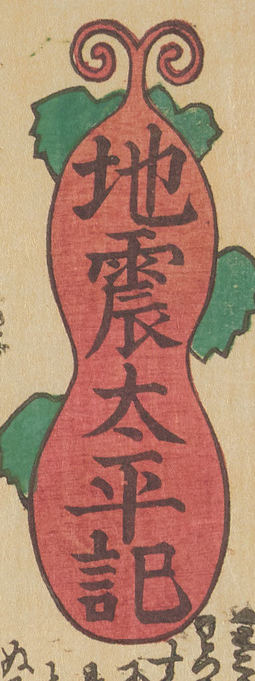地震太平記
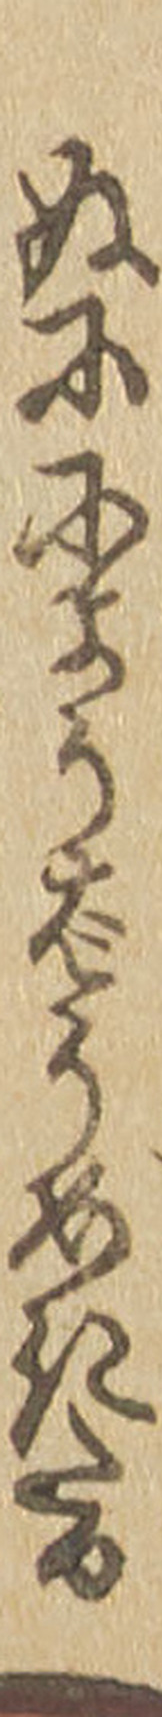ぬににようばうめきたる
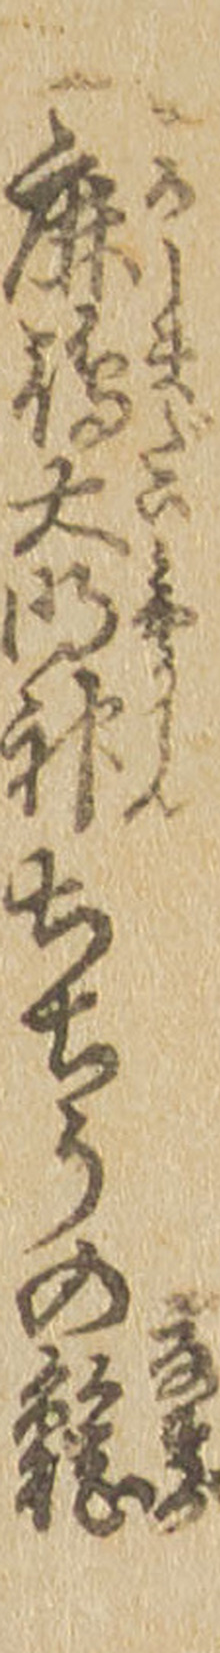鹿島大明神ちちうの鯰
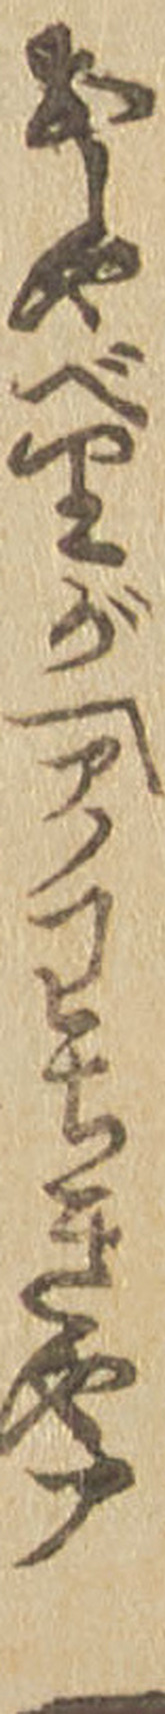おしやべりが｢アノわちきやァ
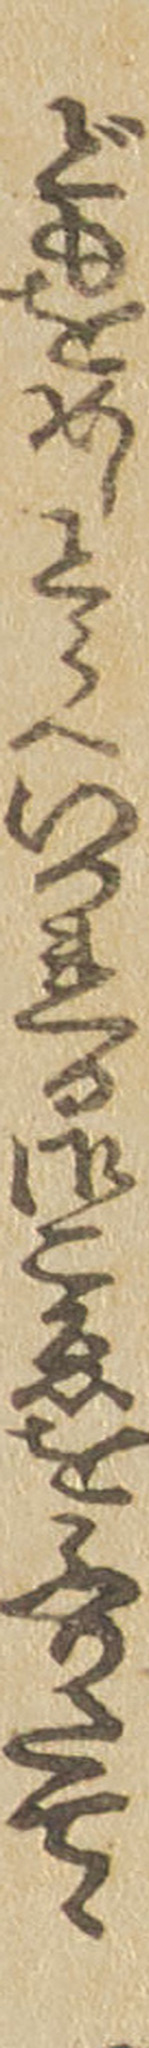どもをめしとらへいかれる御こゑをふりたてゝ
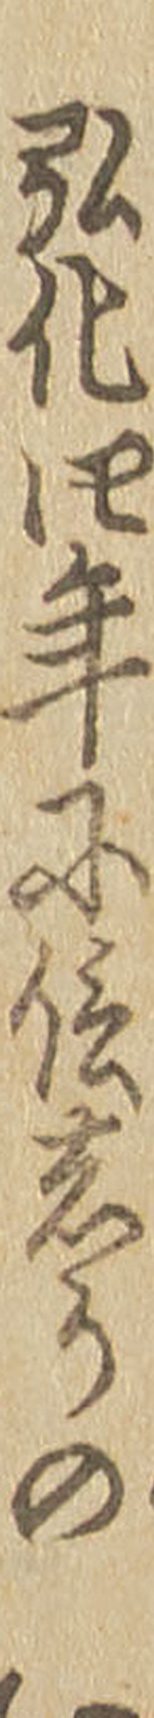弘化四年に信しうの
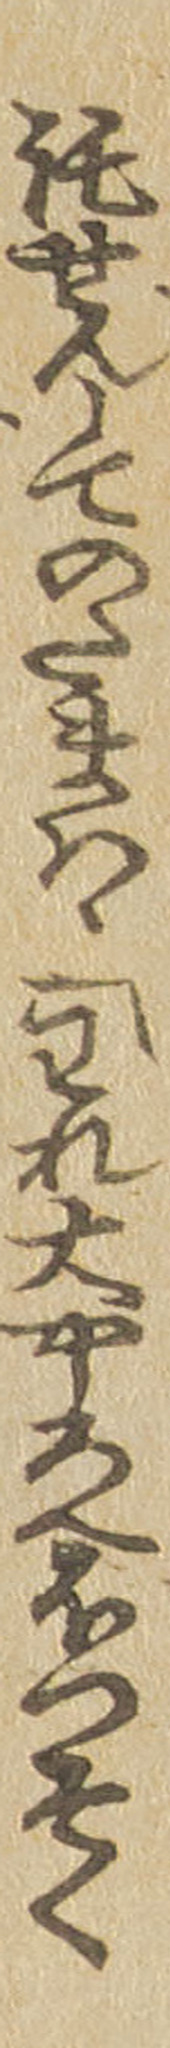託せんしてのたまはゝ｢われ大やしろへほつそく
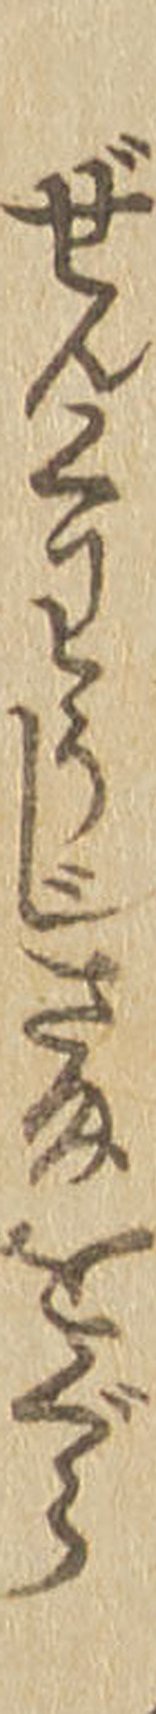ぜんくわうじさまをぐら
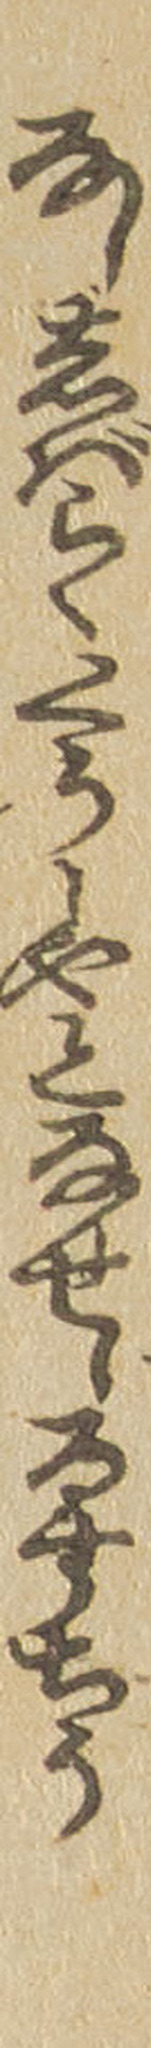なししばらくくうしやとなせしるすちう
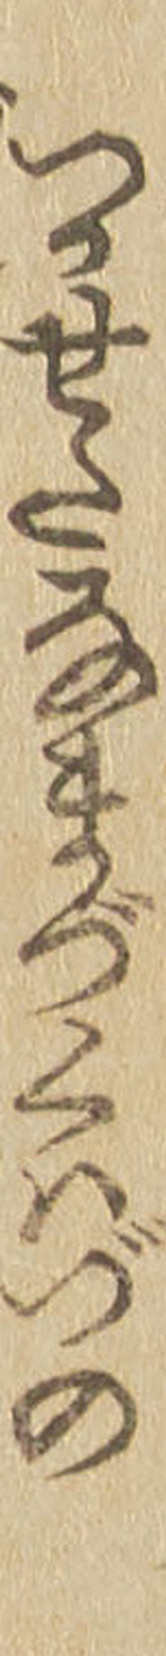つかせたなまづくはづの
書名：地震太平記
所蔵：東京大学総合図書館 General Library in the University of Tokyo, JAPAN
